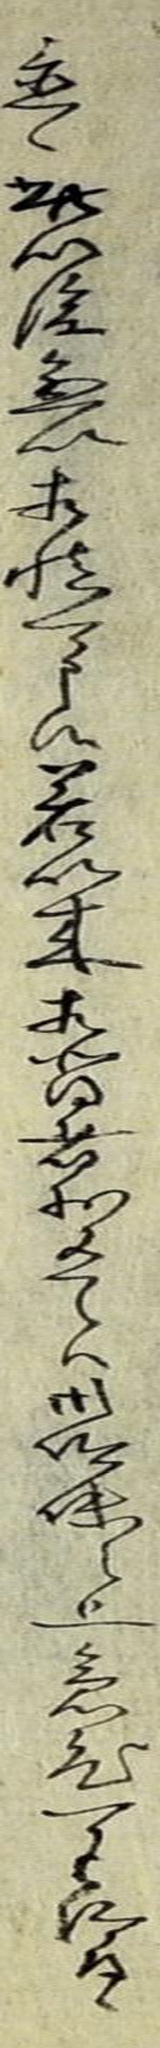置候此以後盆以相慎可申候若以来相背者於有之ハ御吟味之上急度可被仰付候
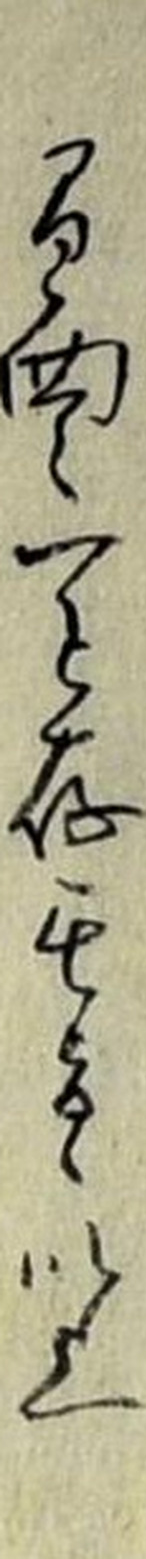間面々可被存其旨候以上
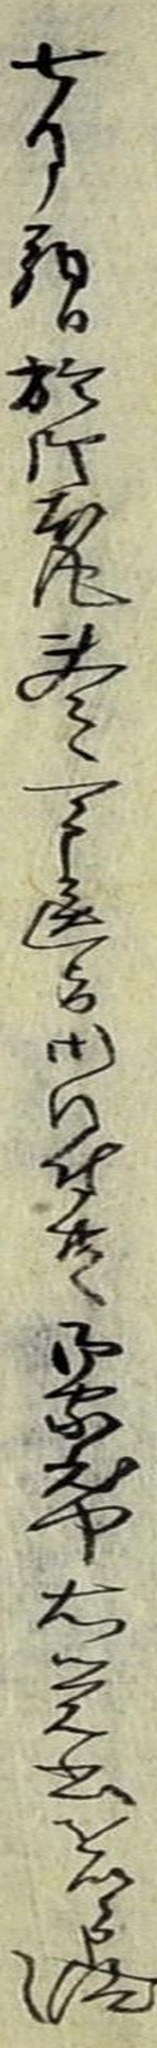七月朔日於御本丸夫々へ可申送旨御目付共へ御家老中右覚書を以被申渡之
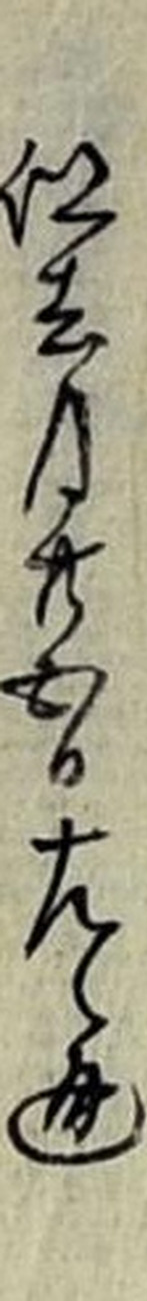但去月廿五日左之通
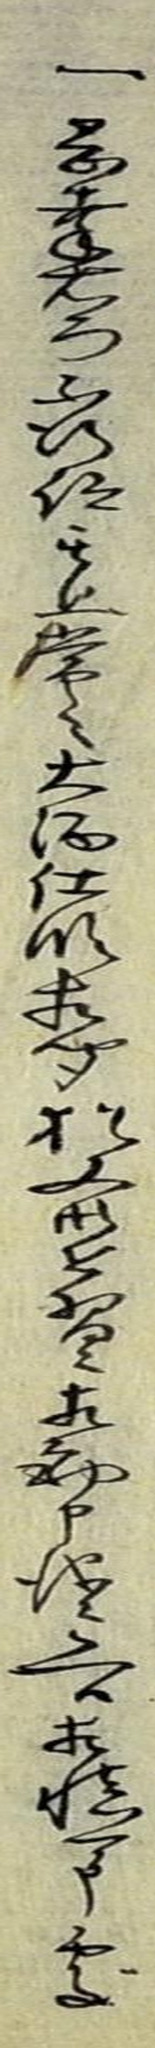一岡幸右衛門不行跡其上常々大酒仕段相聞猶又御近習ニ相勤申儀ニ候ヘハ相慎可申処
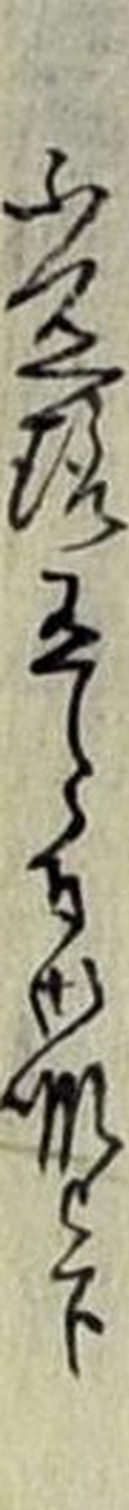不宜趣有之候付御暇被下
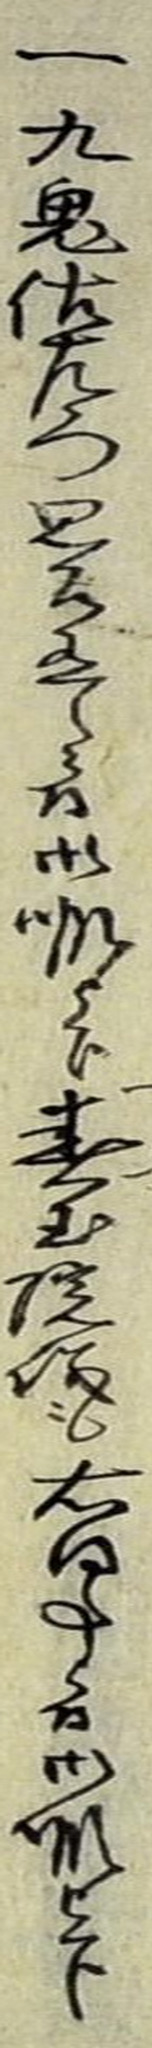一九鬼佐左衛門思召有之ニ付御暇被下春玉院―姉也儀も右同事ニ付御暇被下
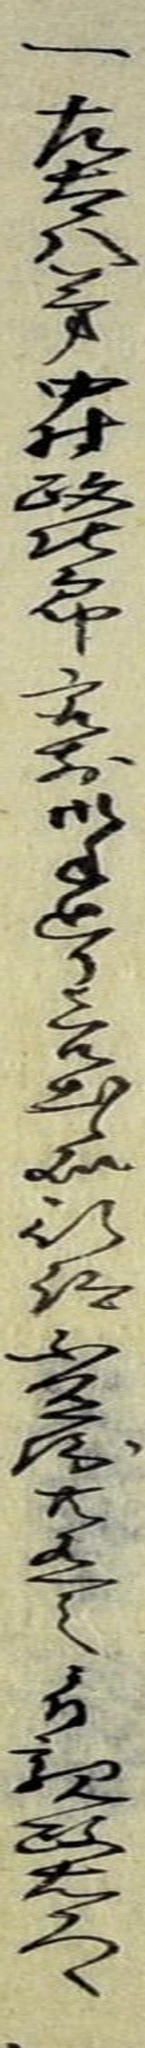一左太八弟中村政次郎最前御手廻り被召出候処行跡不宜儀共有之ニ付親政右衛門へ
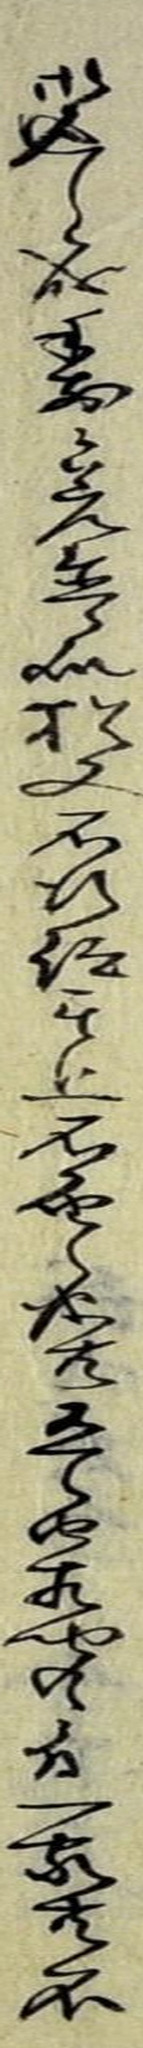御返し被成手前ニ差置候処猶又不行跡其上不届之儀共有之由相聞候ニ付一家共不
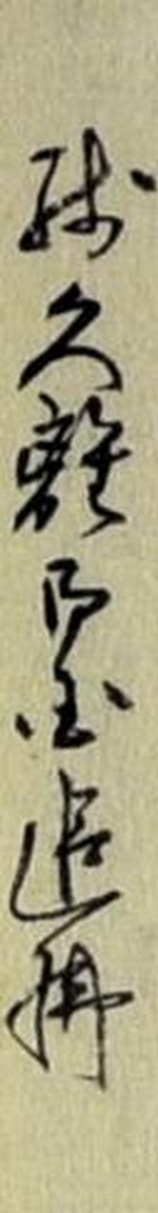残久離御国追払
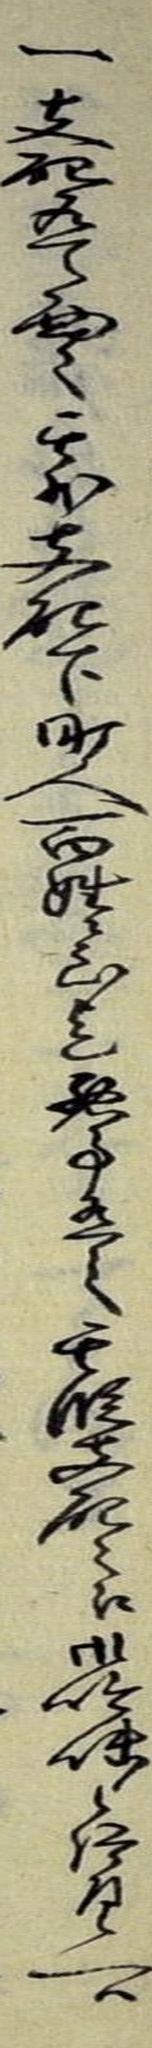一支配有之面々其外支配下町人百姓ニ至迄悪事有之其段支配々江御吟味被仰付候ヘハ
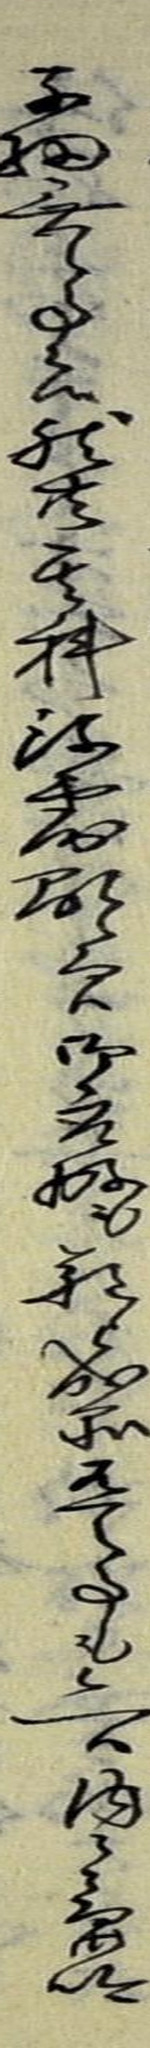子細無之事ニ候然共其科致露顕候而ハ御取扱も難被成品有之事も候ヘハ内々ニ而御吟
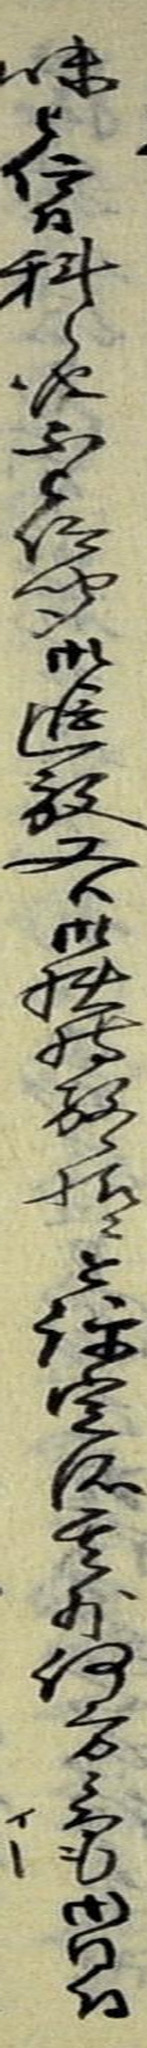味被仰付科之儀不被仰聞御追放又ハ御扶持放候様ニと評定所其外何方ニ而も御目付
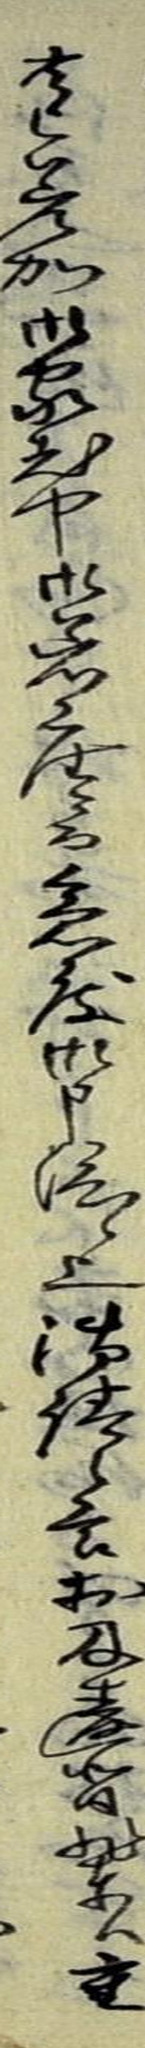共被差加御家老中御着座ニ而急度御申渡候上御請之節於及違背輩ハ重
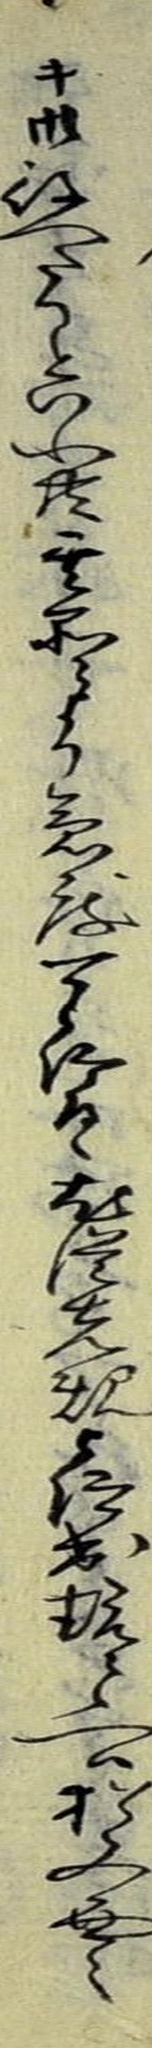キ御役人たりといふ共其品ニより急度可被仰付候尤従先規被仰出趣ニ候ヘハ猶又面々
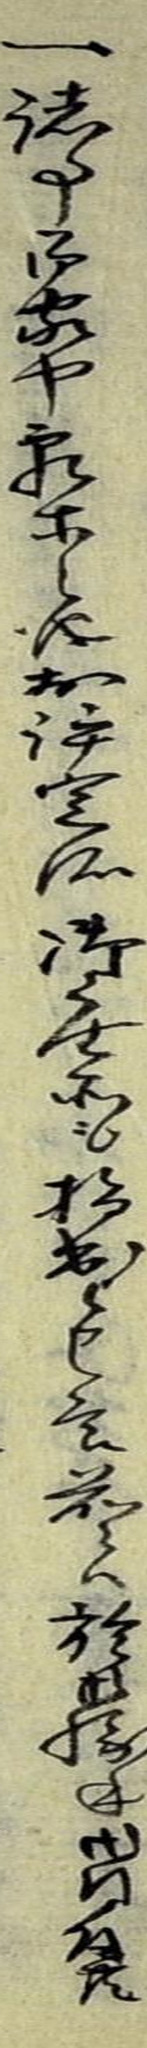一諸事御家中願等之儀於評定所御座所も指出被申候節前々ハ於御勝手御目付共
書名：命令之部 一
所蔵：福井県文書館 Fukui Prefectural Archives
